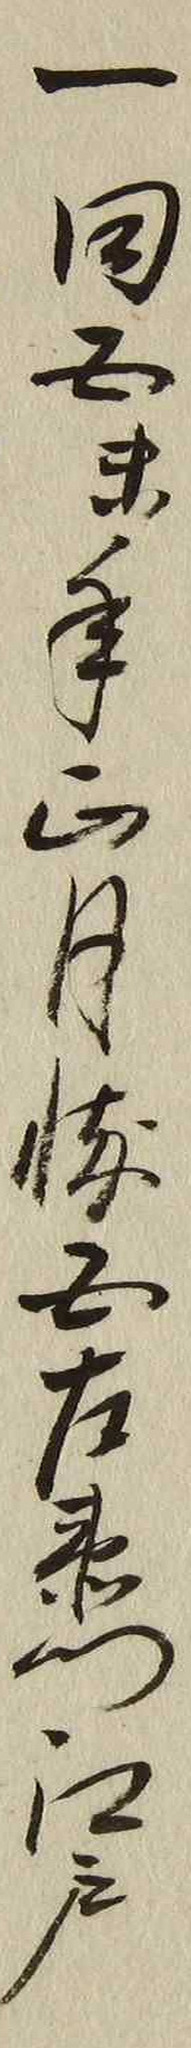一同五未年正月忰五左衛門江戸
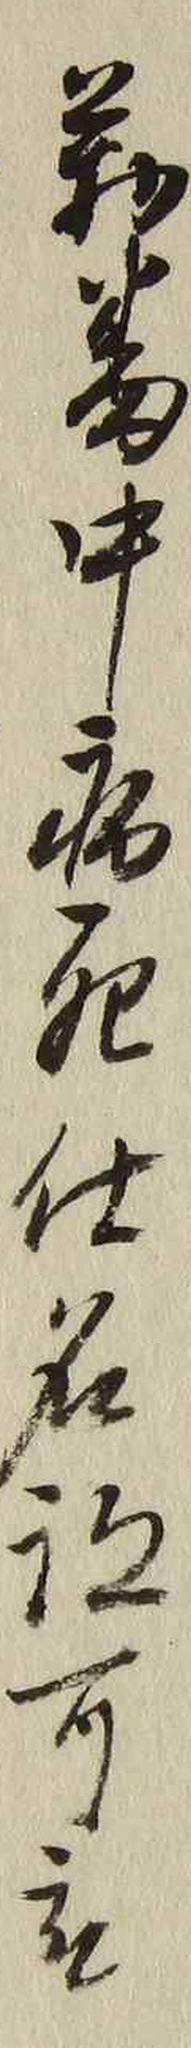勤番中病死仕名跡可被
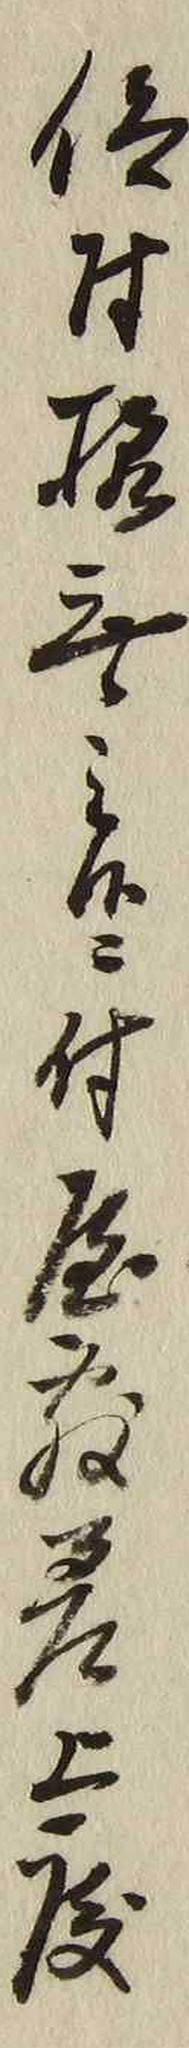仰付様無之候ニ付屋敷差上度
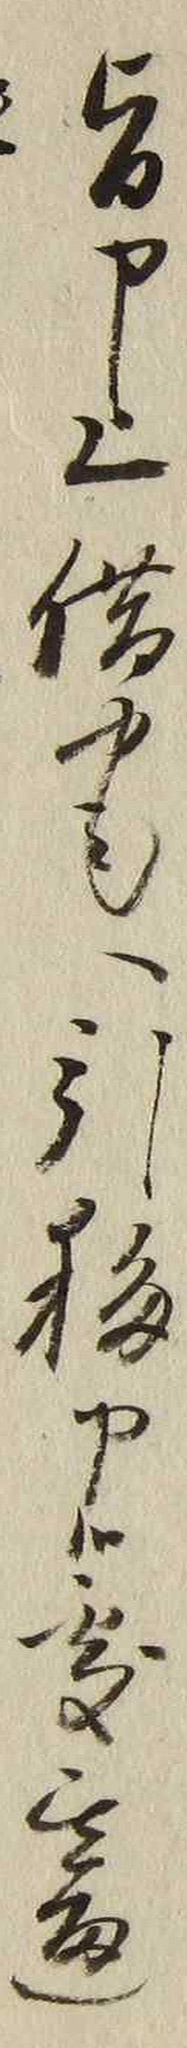旨申上借宅へ引移申候処其通
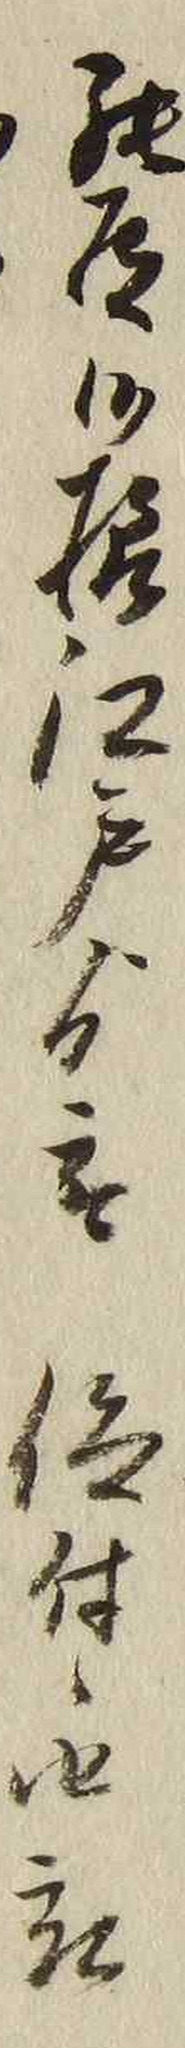罷有候様江戸ゟ被仰付候由被
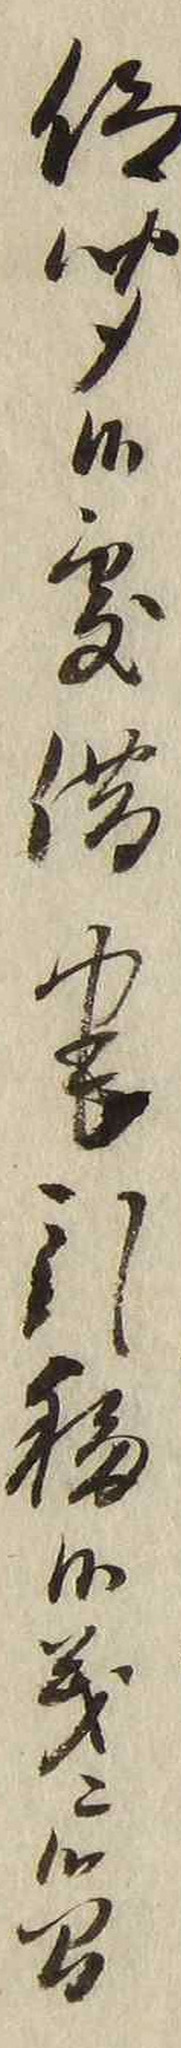仰聞候処借宅引移候義ニ候間

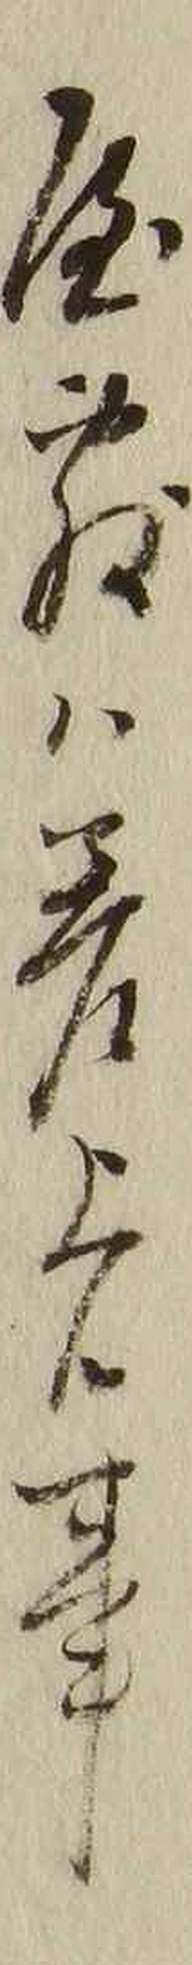屋敷ハ差上候事
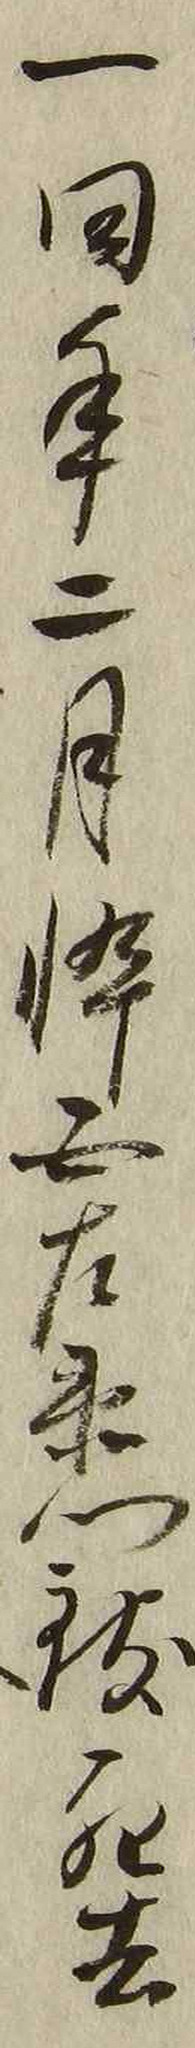一同年二月忰五左衛門致死去
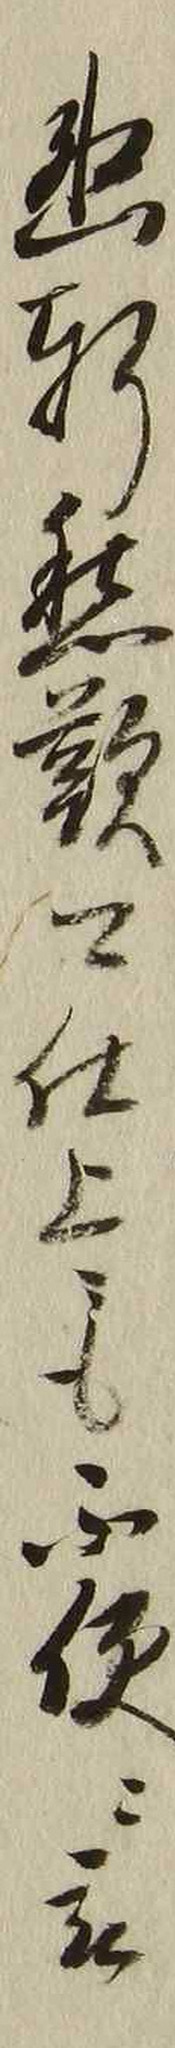幽軒愁歎可仕上ニも不便ニ被
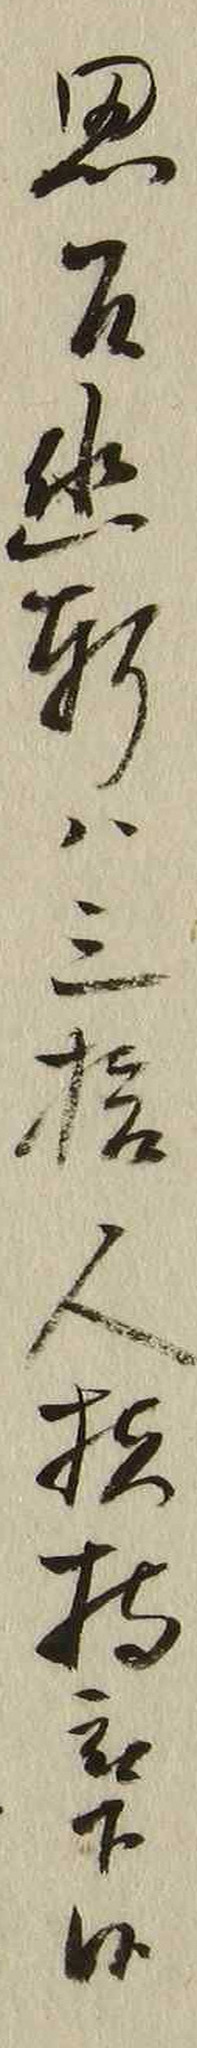思召幽軒ハ三拾人扶持被下候
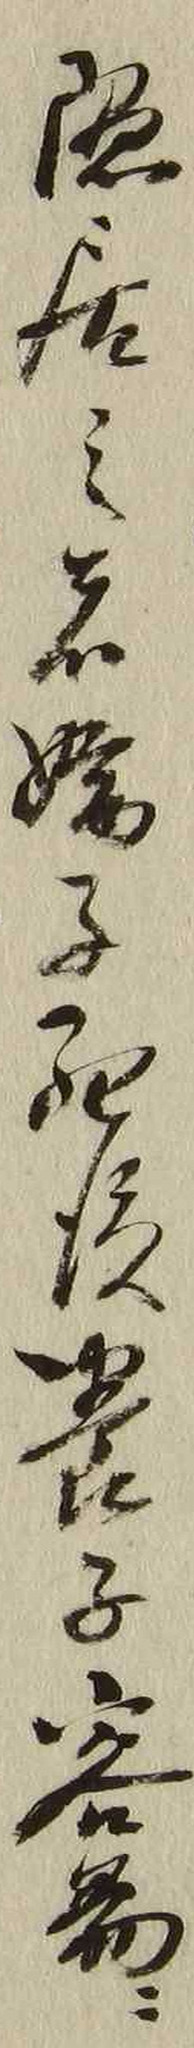隠居之者嫡子死後養子容易ニ
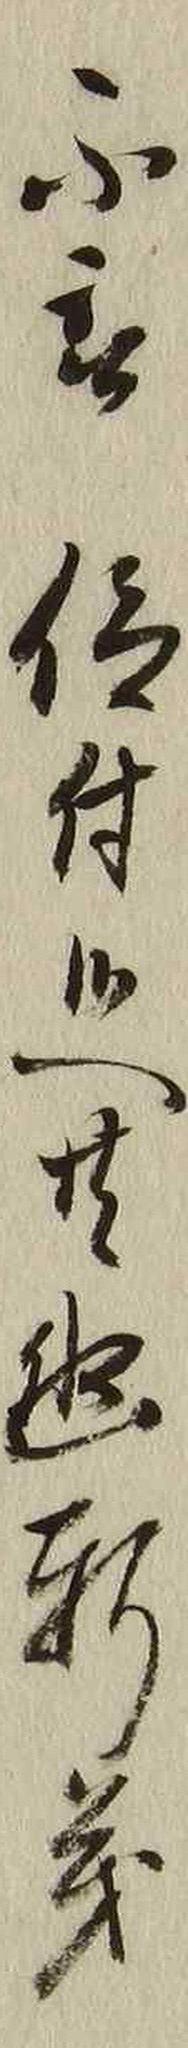不被仰付候へ共幽軒義
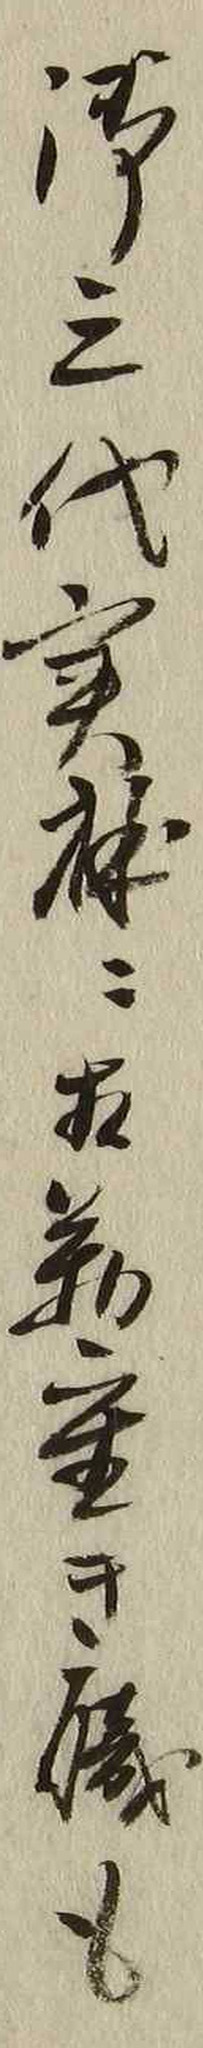御三代実体ニ相勤重き職も
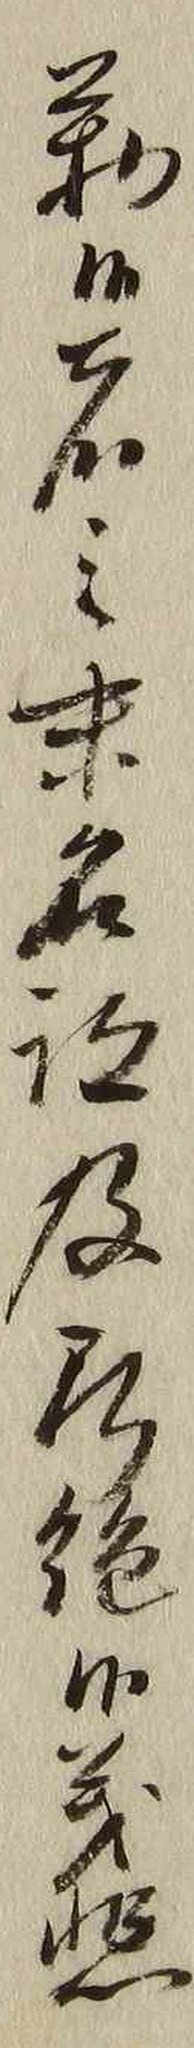勤候者之末名跡及断絶候義悲
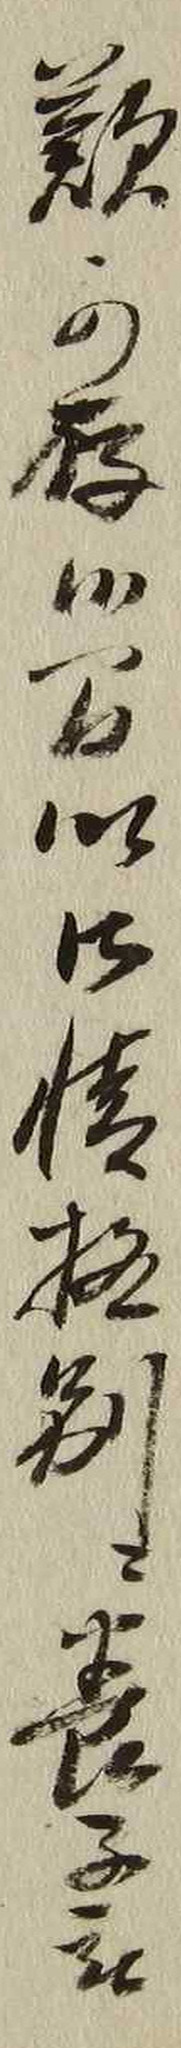歎可存候間以御情格別ニ養子被
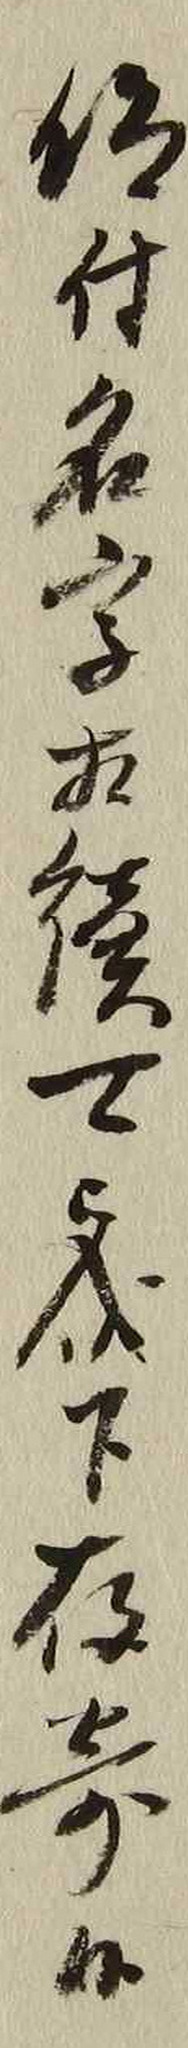仰付名字相続可被成下存寄候
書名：諸士系譜　巻之355　す之部5
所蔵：会津若松市立会津図書館
